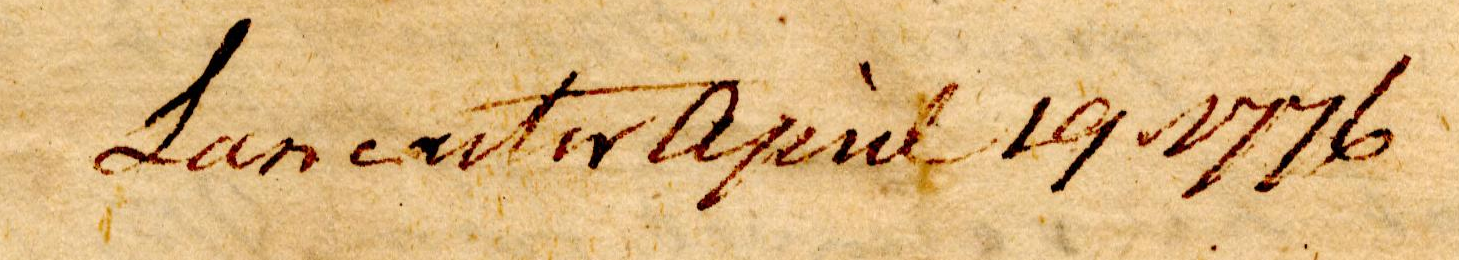Lancaster April 19 1776
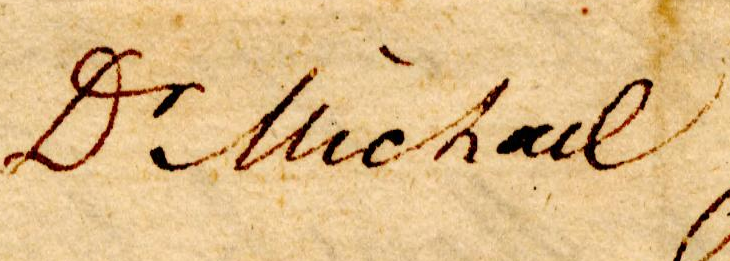D^r Michael
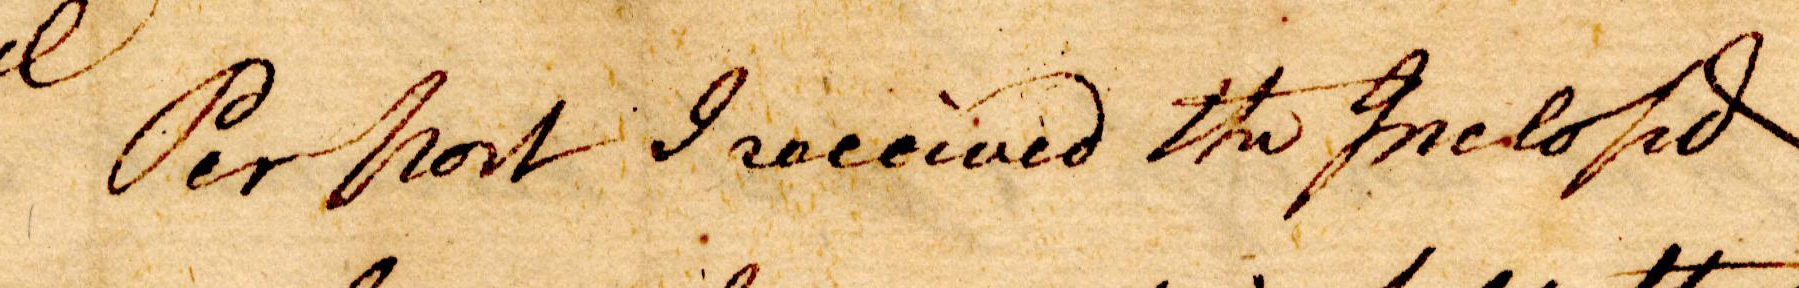Per post I received the Inclosed
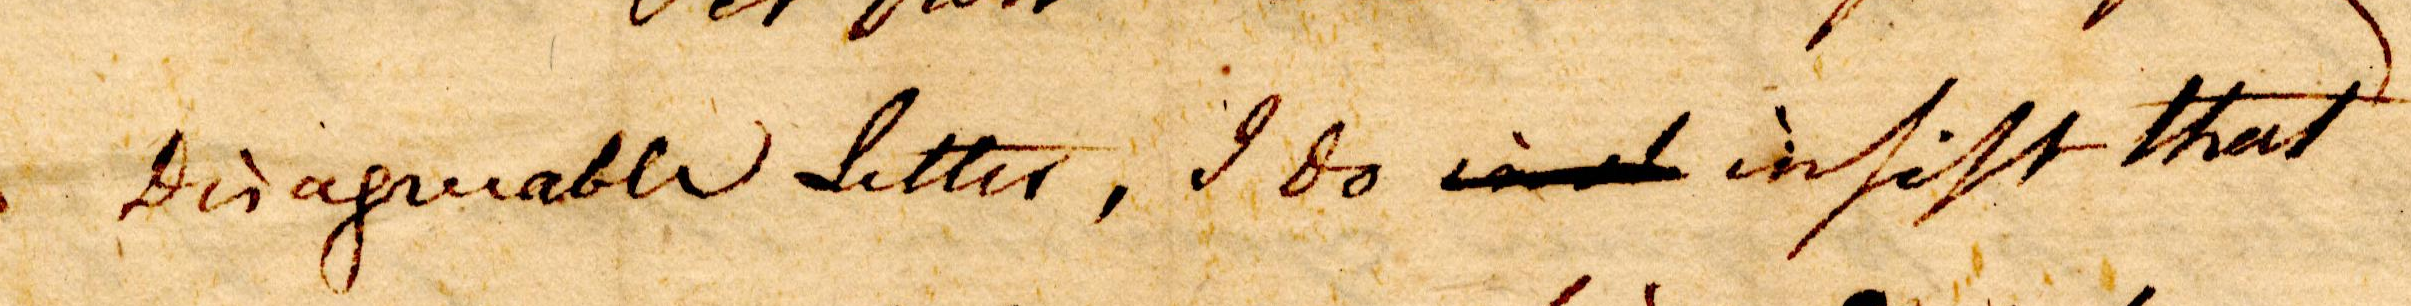Disagreeable Letter, I do [____] insist that
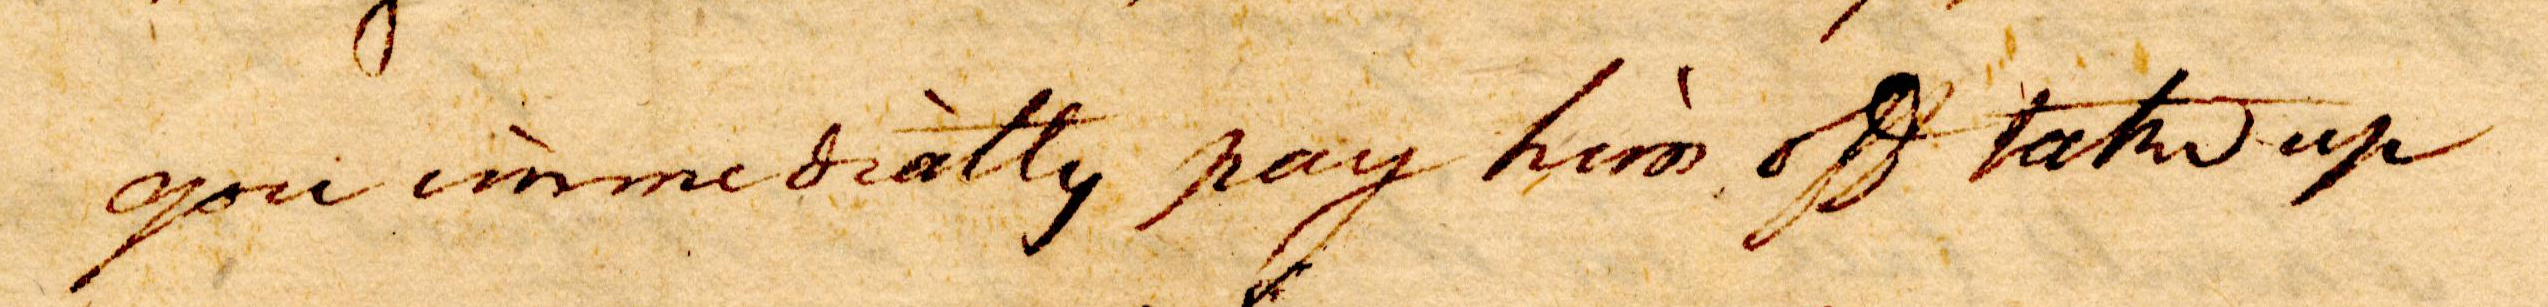you immediatly pay him off take up
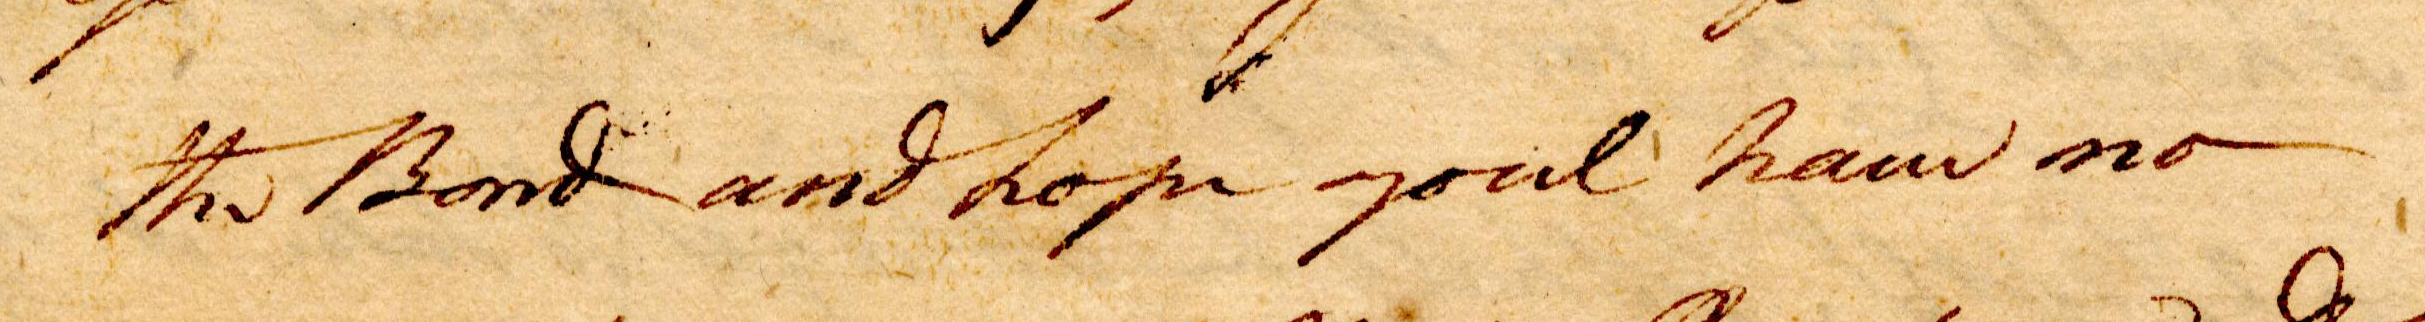the Bond and hope youl have no
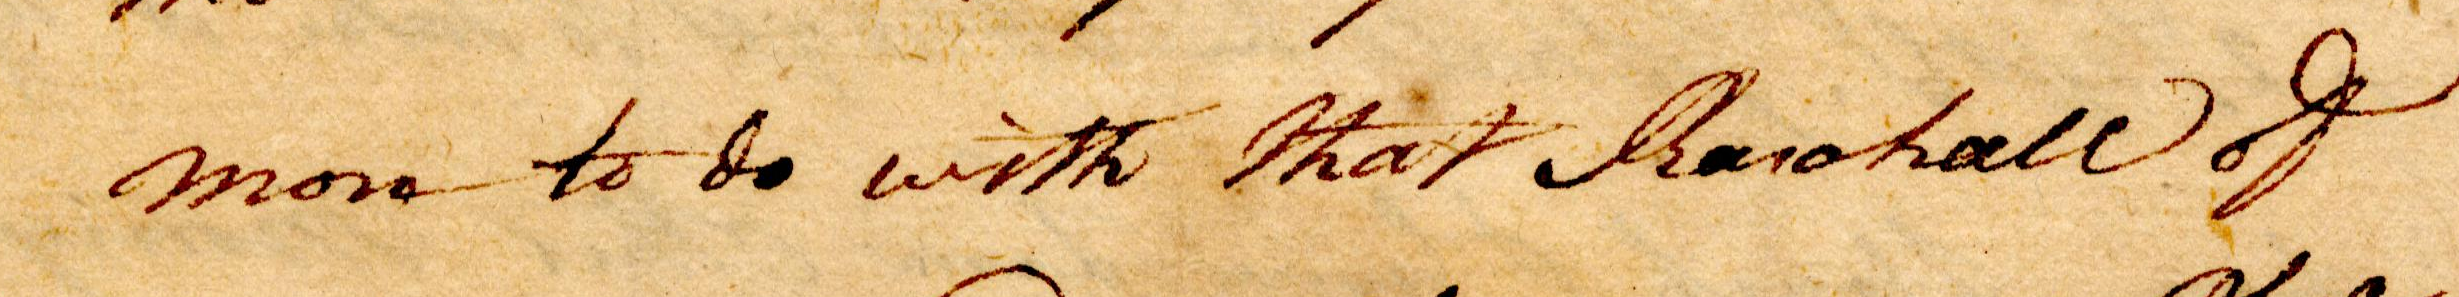more to to with that Raschall of
